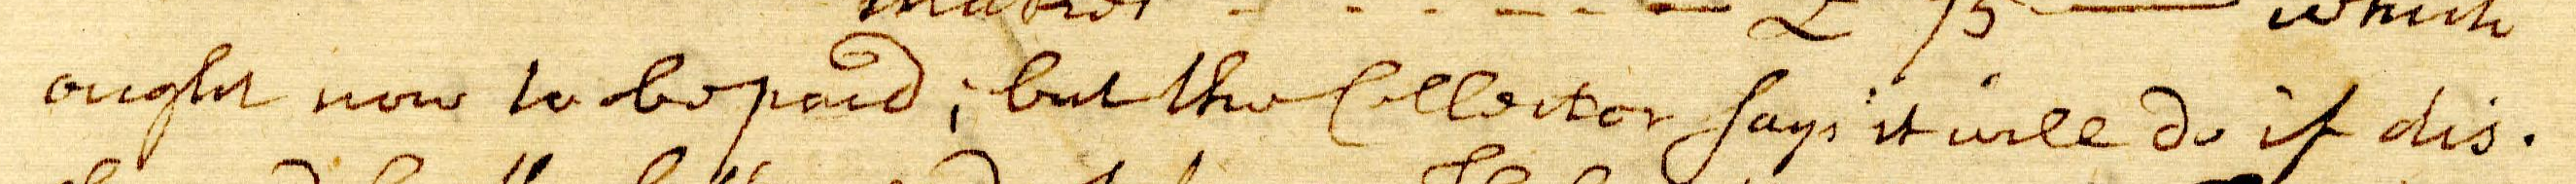ought now to be paid; but the Collector says it will do if dis.
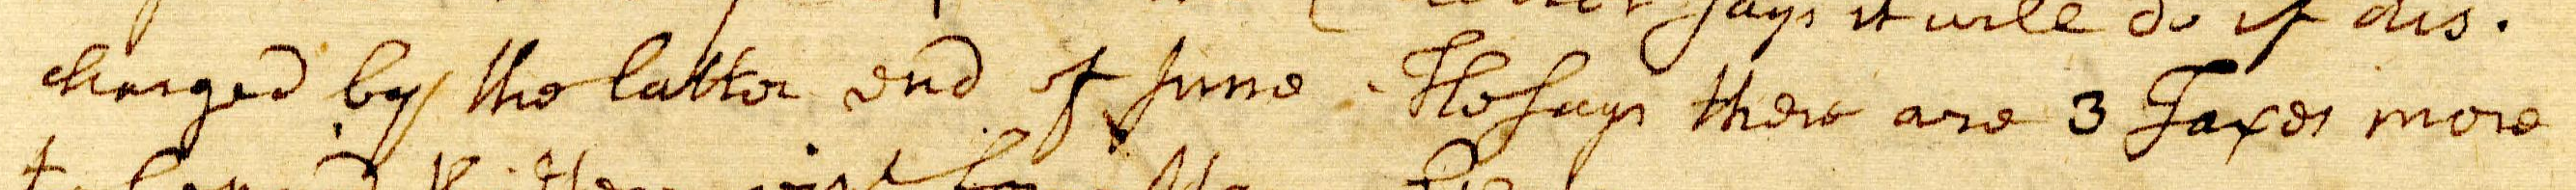charged by the latter end of June He says there are 3 Taxes more
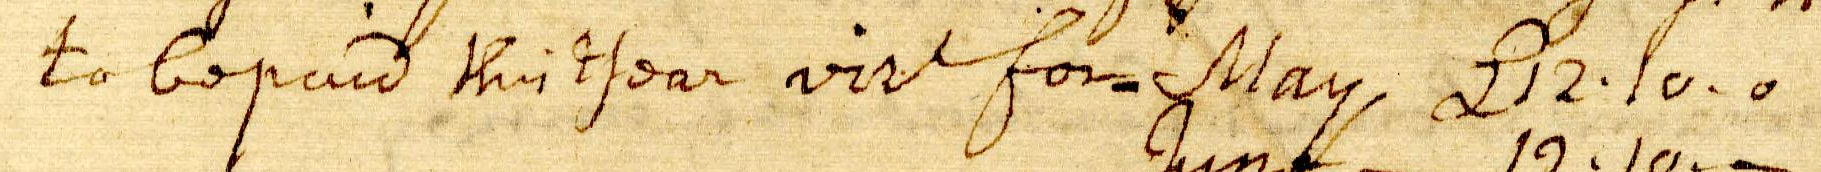to be paid this year viz^t for May, £12.10.0
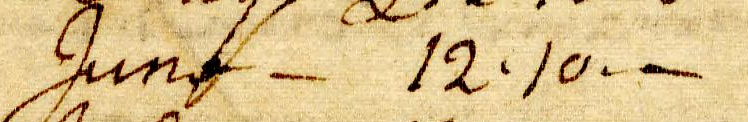June- 12.10-
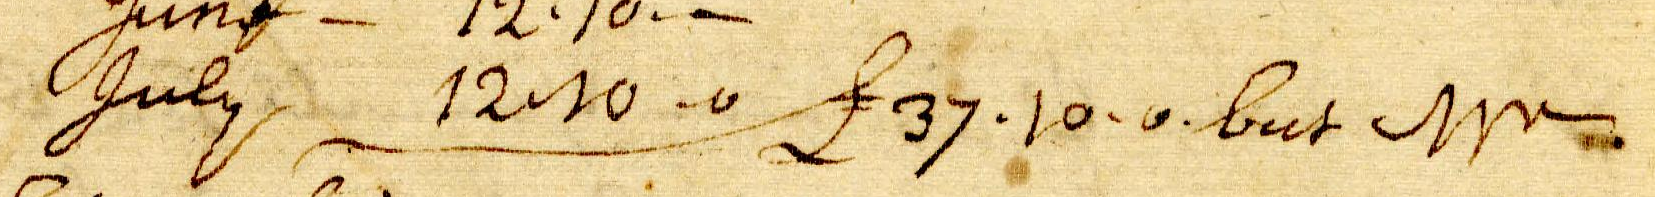July 12.10- £ 37.10.6 but M^r.
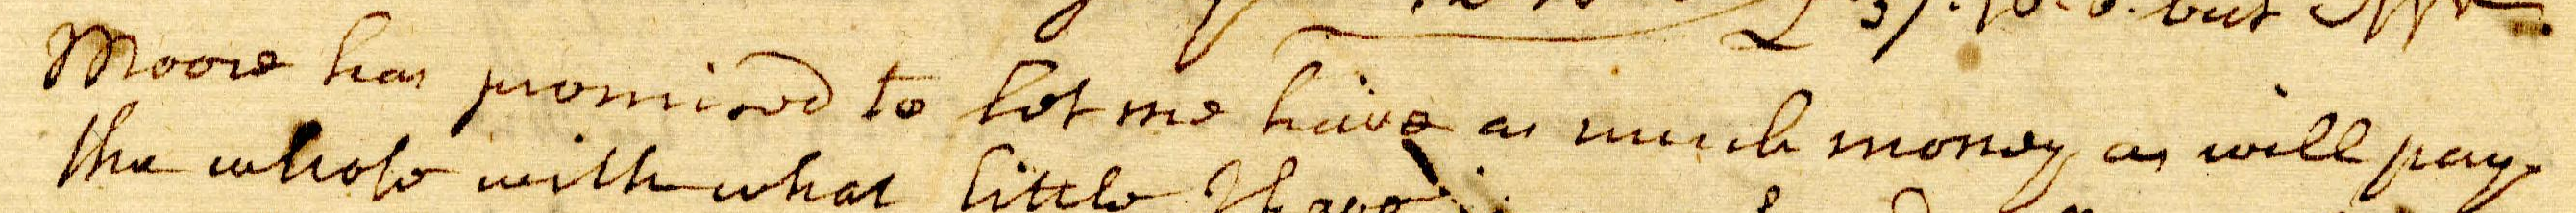Moore has promised to let me have as much money as will pay
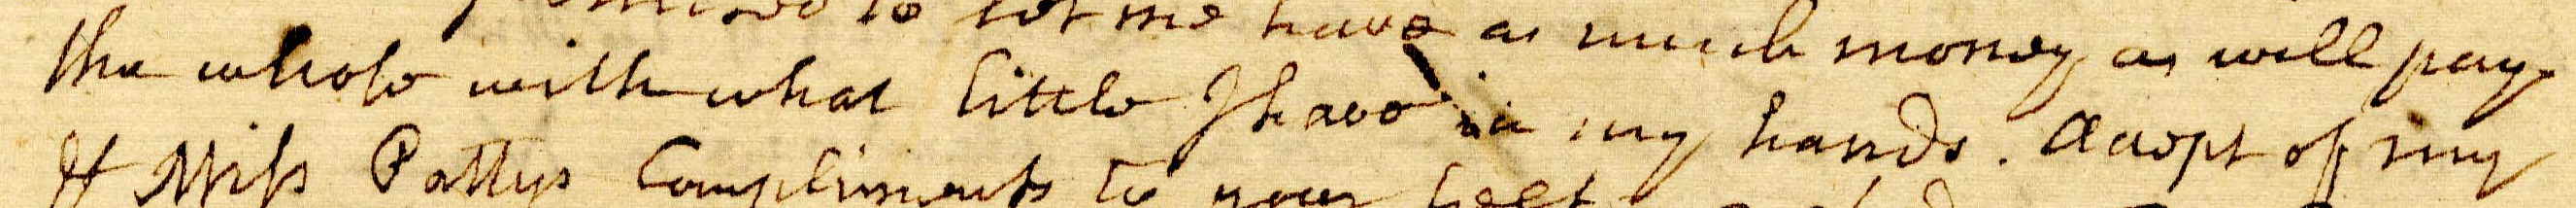the whole with what little I have in my hands. Accept of my
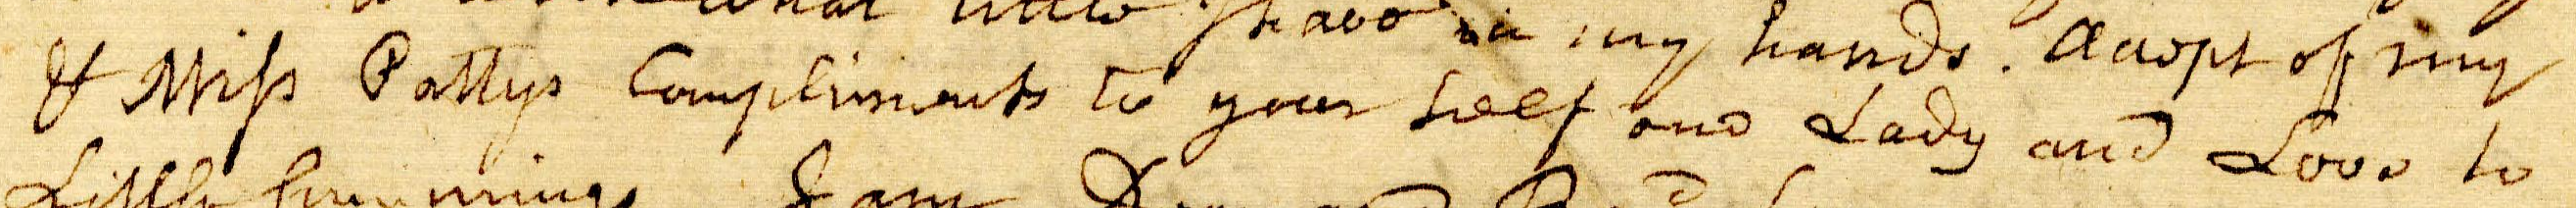& Miss Pattys Compliments to your Self and Lady and Love to
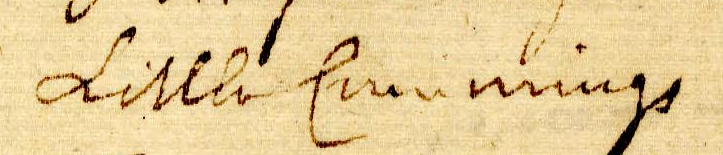Little Cummings
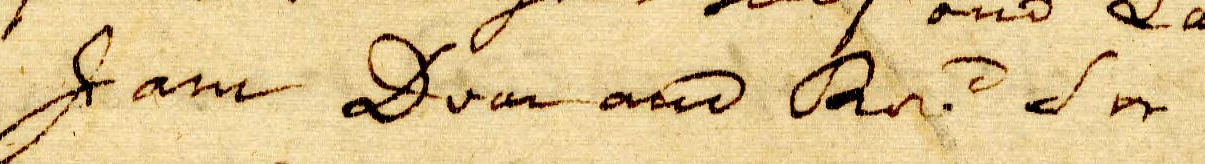I am Dear and Rev.^d Sir
